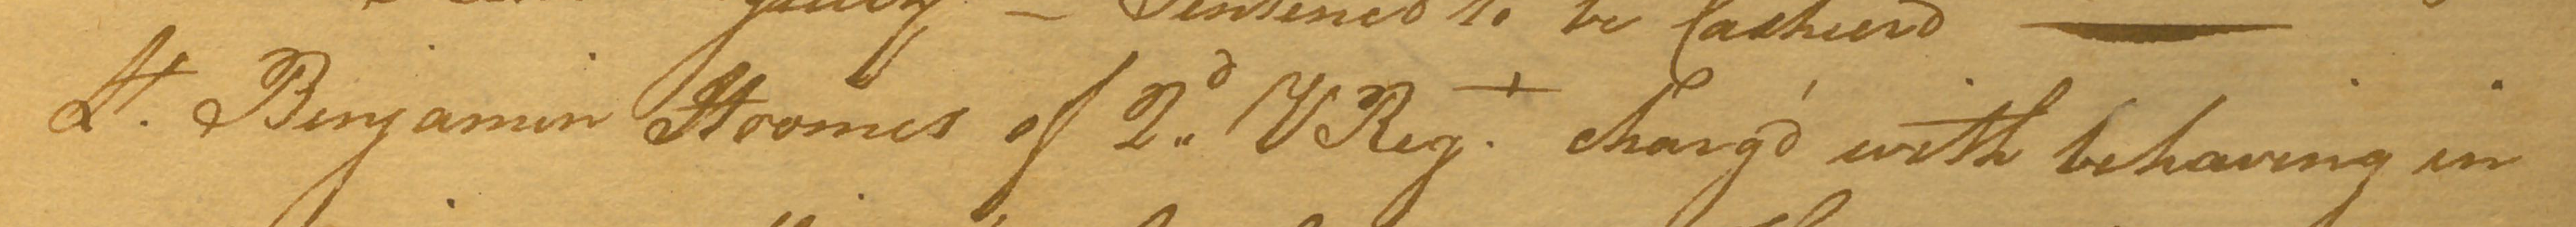L^t. Benjamin Stoomes of 2^d. V Reg^t. charg'd with behaving in
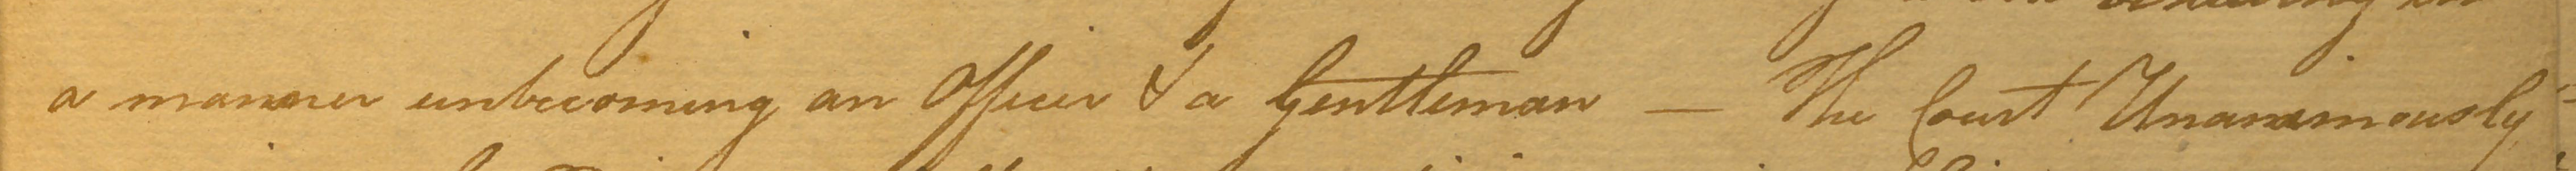a manner unbecoming an Officer & a Gentleman- The Court Unanimously
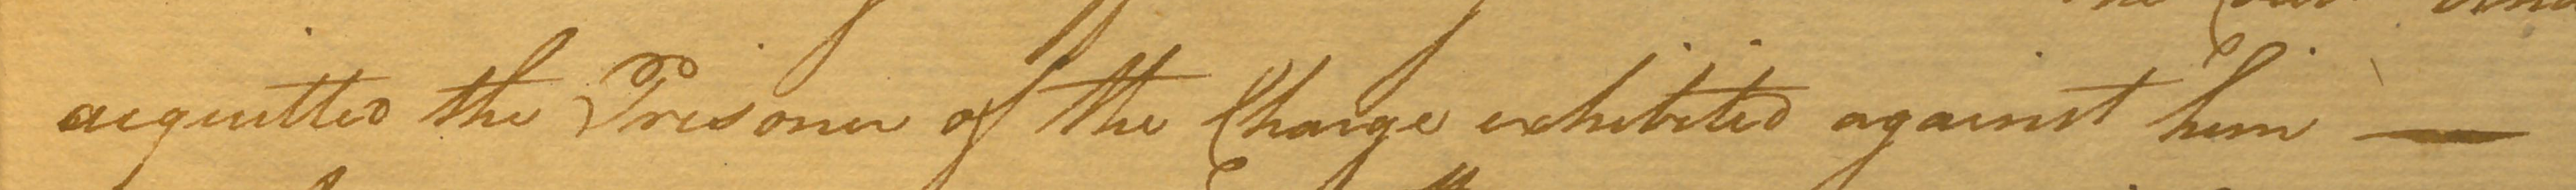acquitted the Prisoner of the Charge exhibited against him-
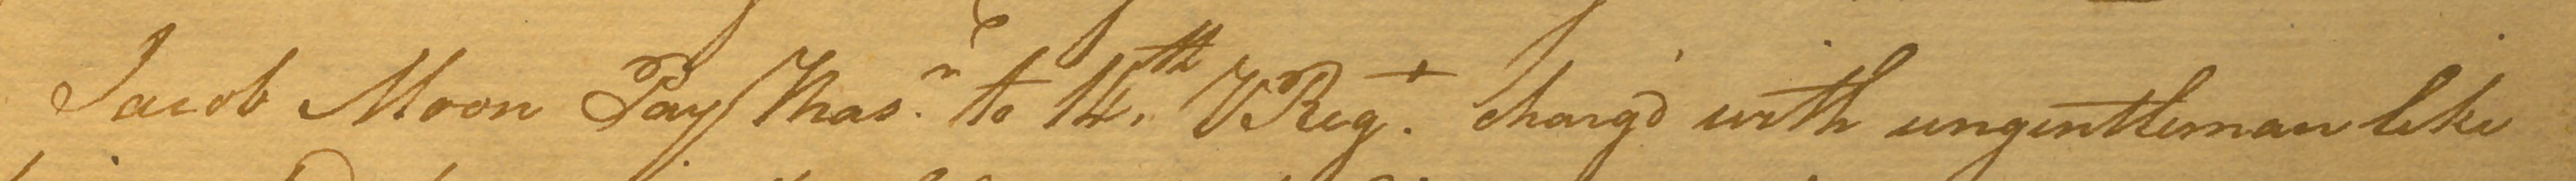Jacob Moon Pay Mas^r. to 14^th. V Reg^t. chargd with ungentlemanlike
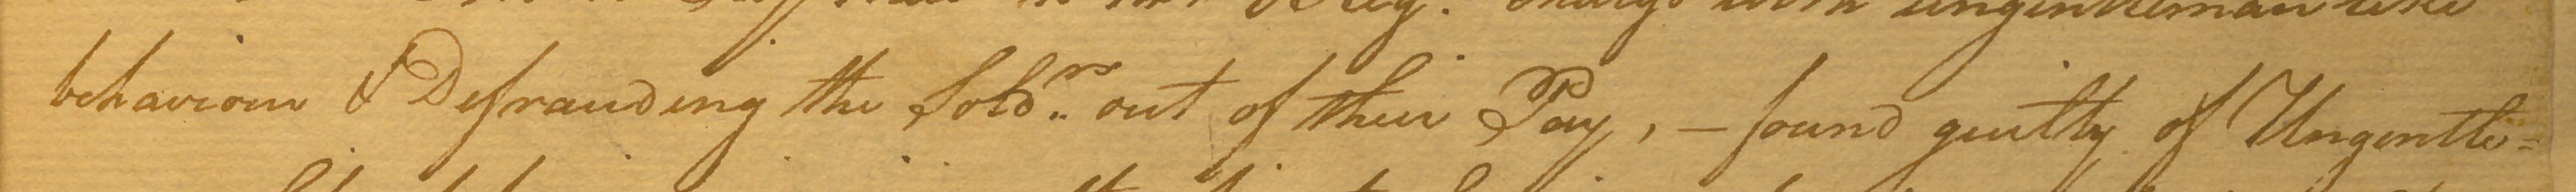behavior & Defrauding the Sold^rs. out of their Pay,- found guilty of Ungentle-
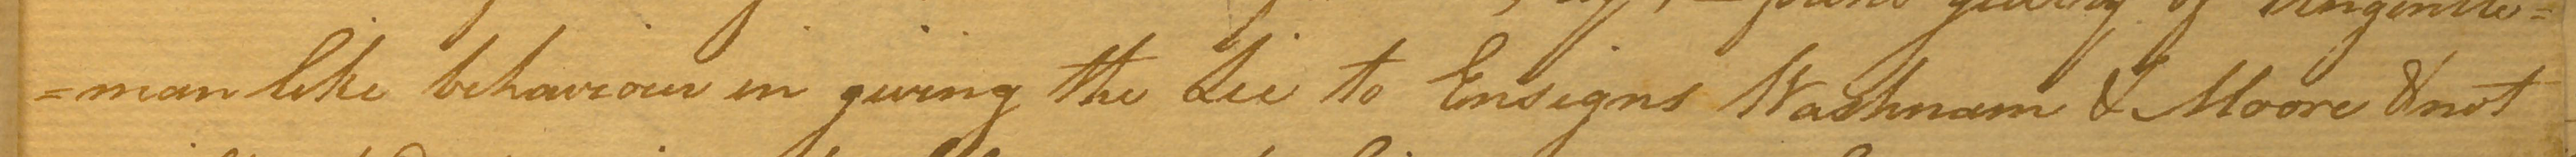-manlike behavior in giving the Lie to Ensigns Washmam & Moore & not
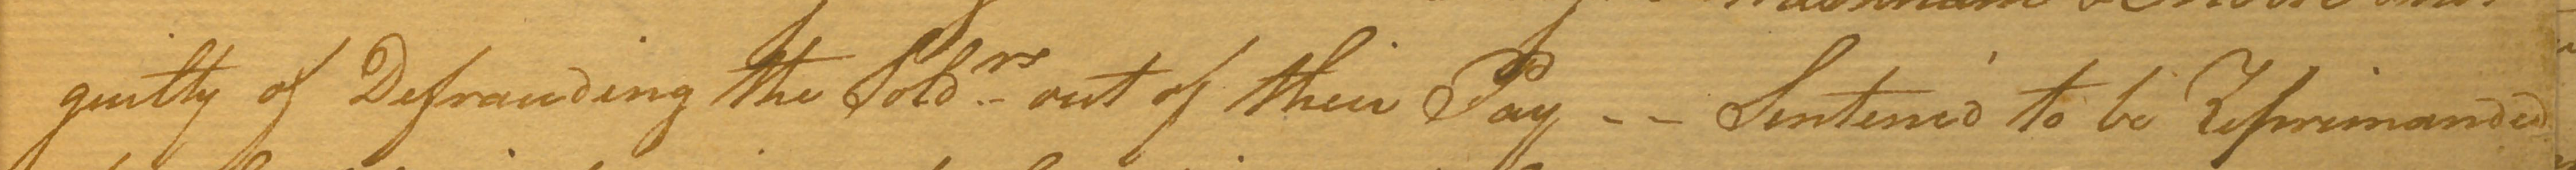guilty of Defrauding the Sold^rs. out of their Pay.. Sentenc'd to be Reprimanded
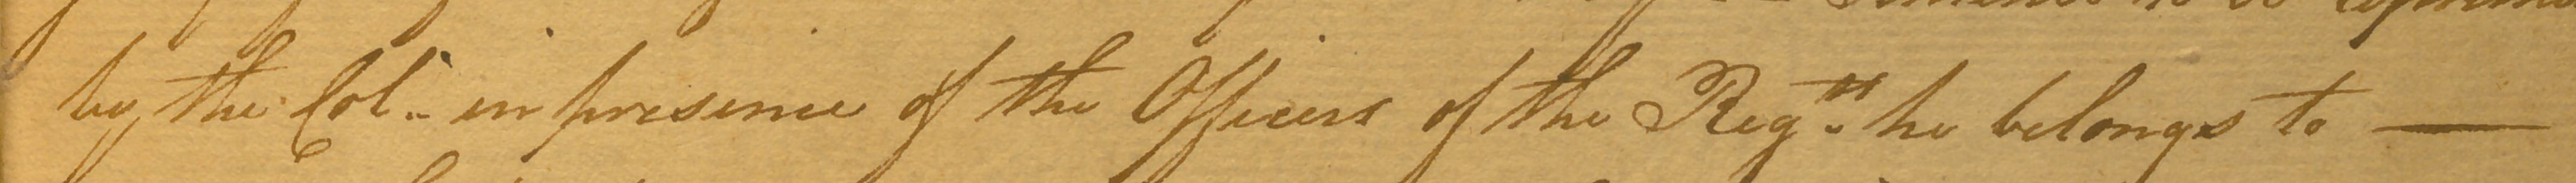by the Col. in presence of the Officers of the Reg^t. he belongs to-
